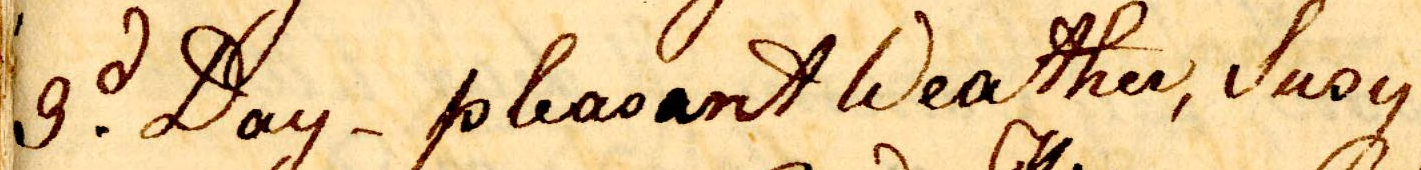3^d. Day- pleasant Weather, Susy
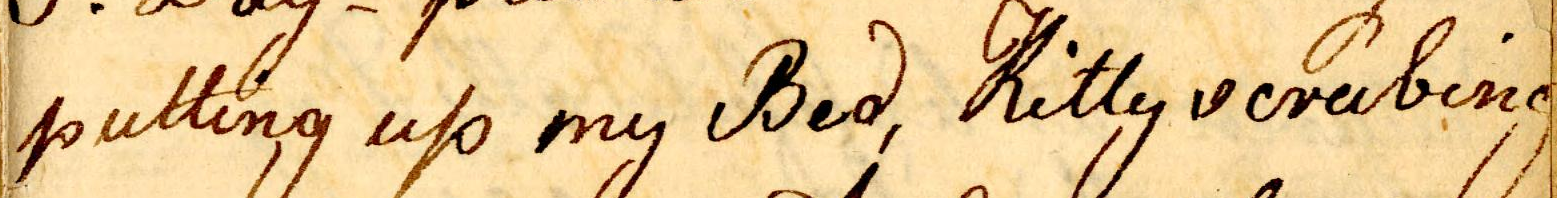putting up my Bed, Kitty scrubing
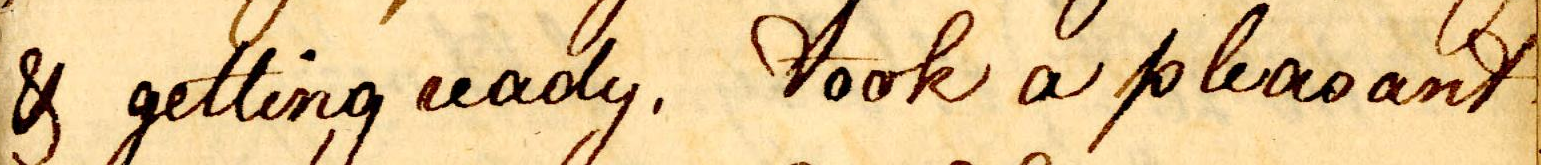& getting ready, took a pleasant
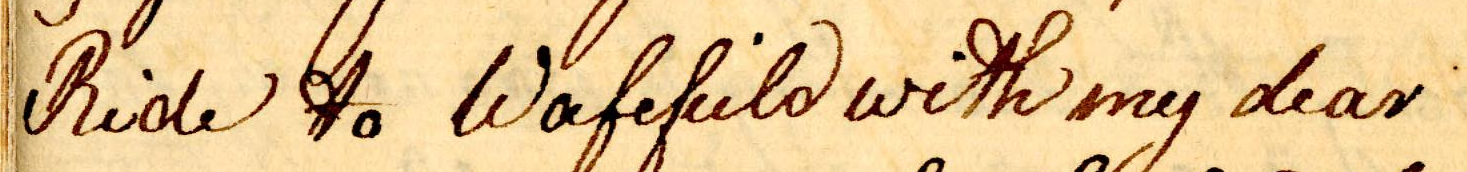Ride to Wafefeild with my dear
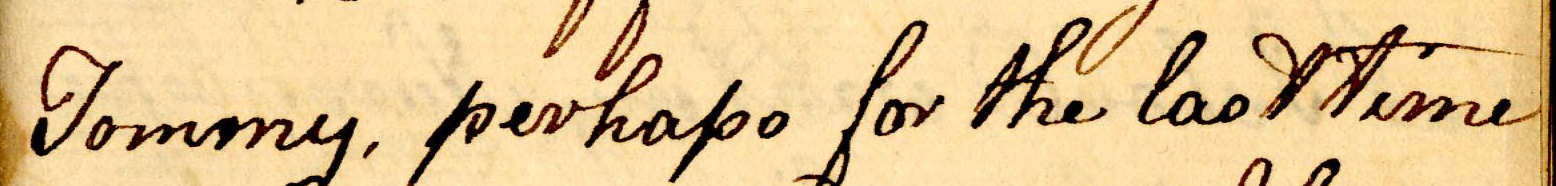Tommy, perhaps for the last time
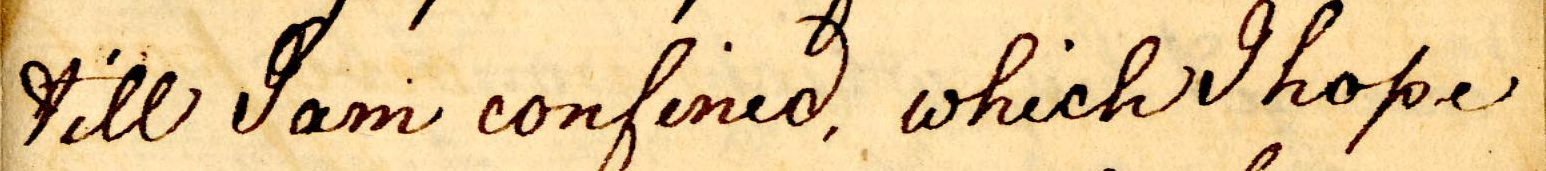till I am confined, which I hope
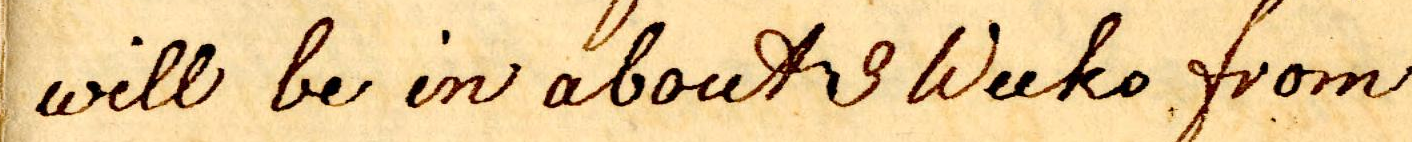will be in about 3 Weeks from
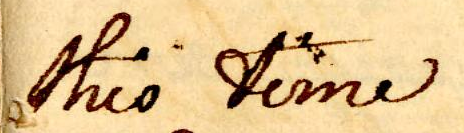this time
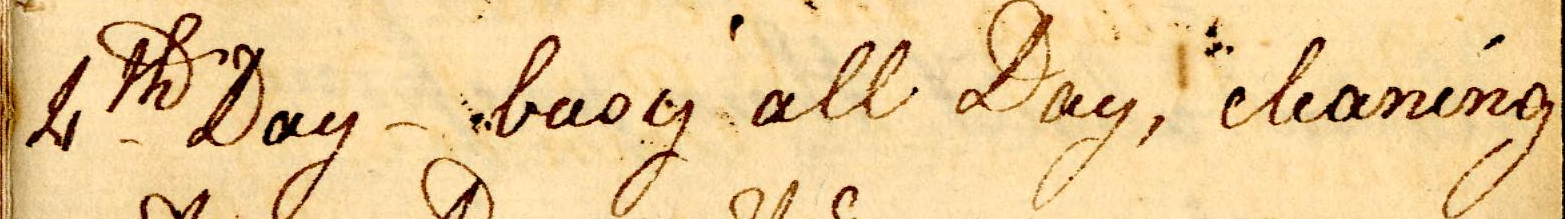4^th Day- busy all Day, cleaning
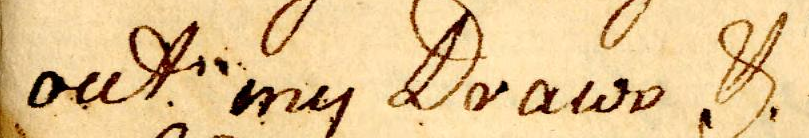out my Draws &^c
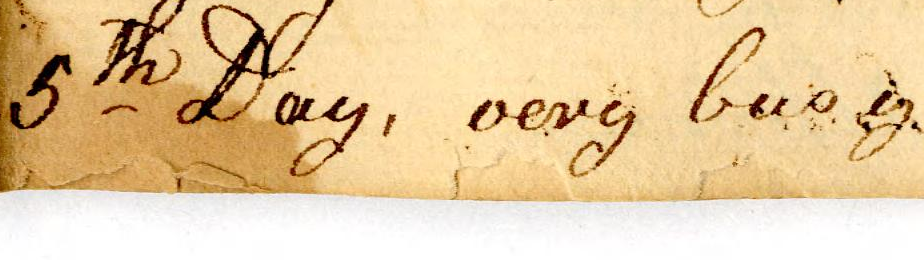5^th Day, very busy
